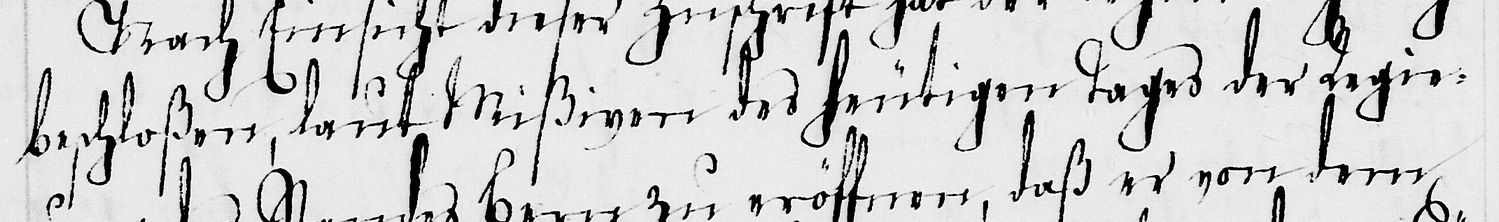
beschloßen, laut Mißiven des heutigen Tages der Regie¬
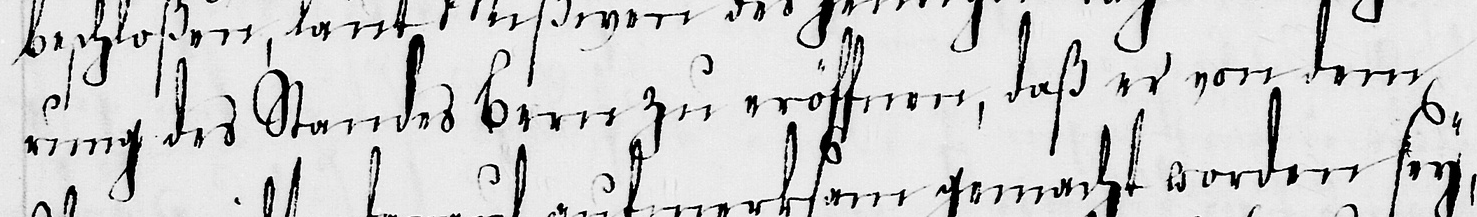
rung des Standes Bern zu eröffnen, daß er von dem
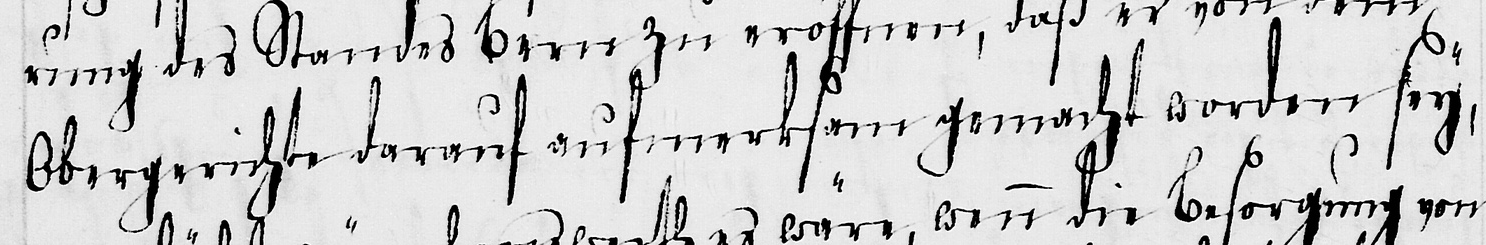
Obergerichte darauf aufmerksam gemacht worden sey,
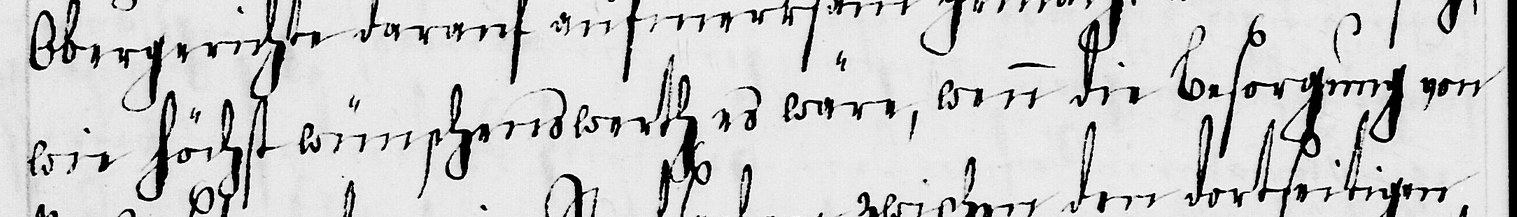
wie höchst wünschenswerth es wäre, wenn die Besorgung von
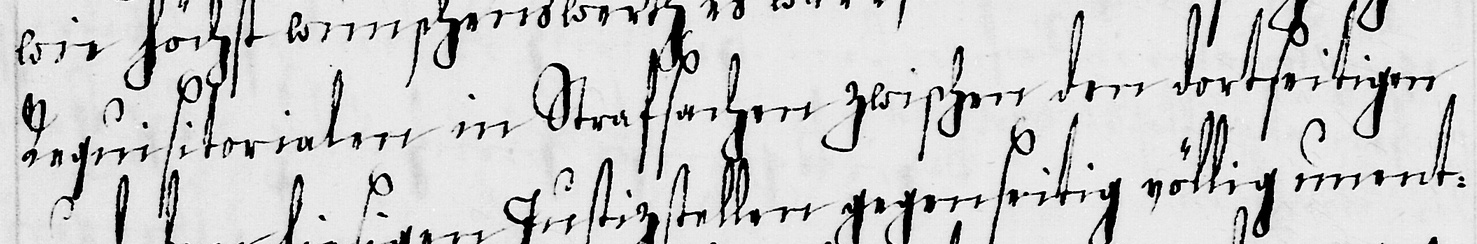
Requisitorialen in Strafsachen zwischen den dortseitigen
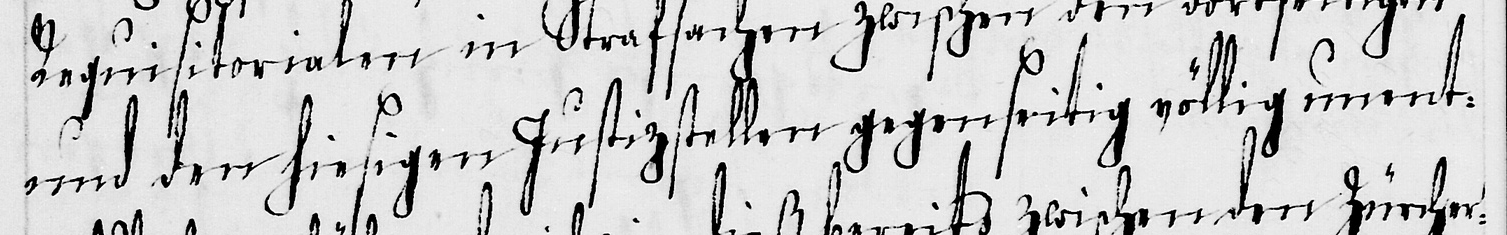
und der hiesigen Justizstellen gegenseitig völlig unen¬
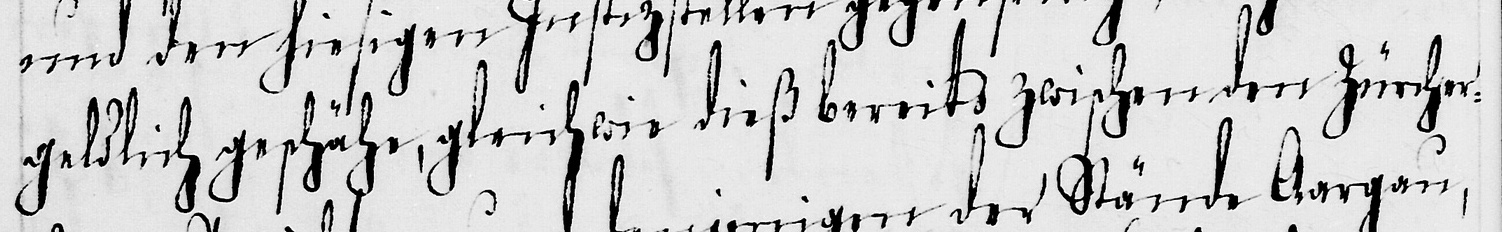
tgeldlich geschähe, gleich wie dieß bereits zwischen den Zürcher¬
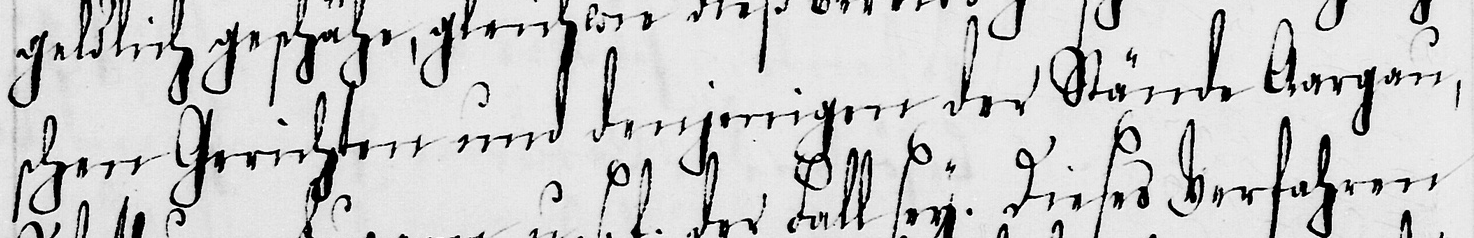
schen Gerichten und denjenigen der Stände Aargau,
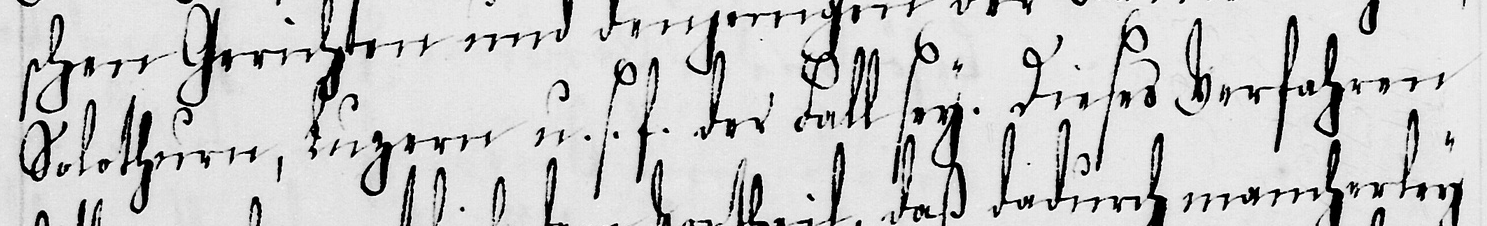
Solothurn, Luzern u. s. f. der Fall sey. Dieses Verfahren
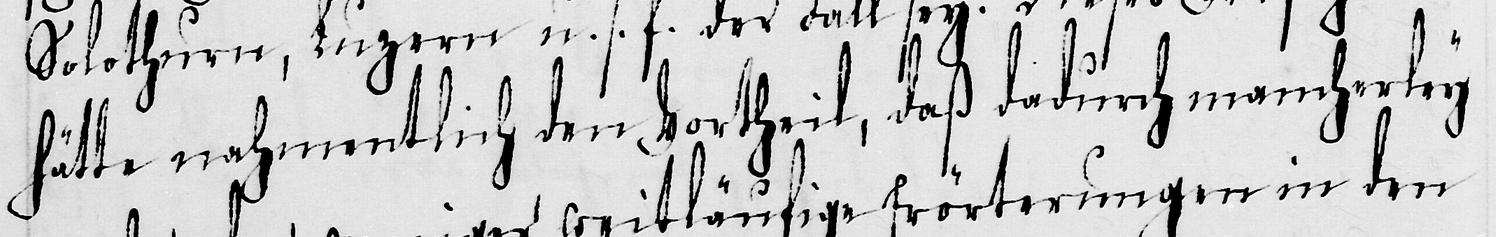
hätte nahmentlich den Vortheil, daß dadurch mancherley
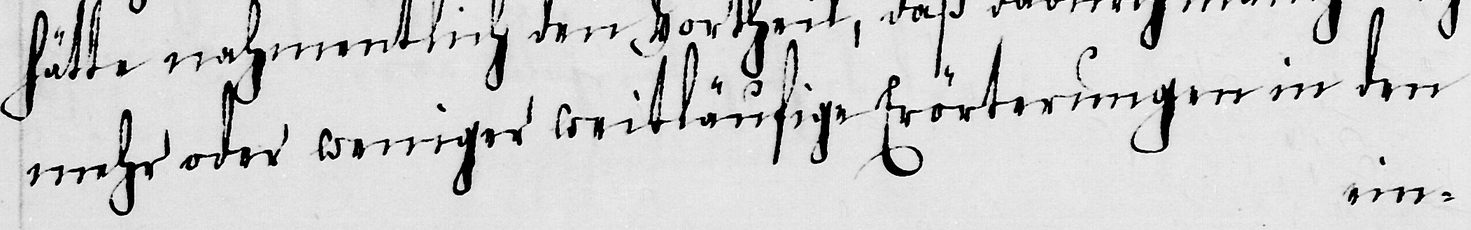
mehr oder weniger weitläufige Erörterungen in den
